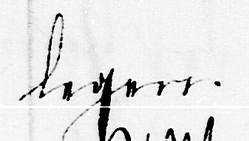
legen.
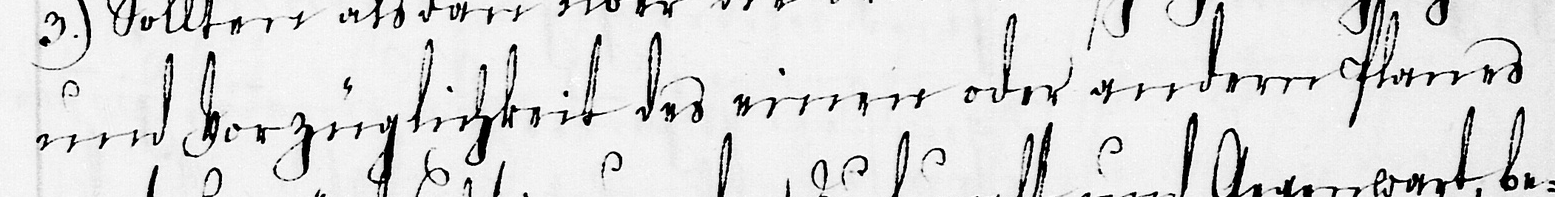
und Vorzüglichkeit des einen oder andern Planes
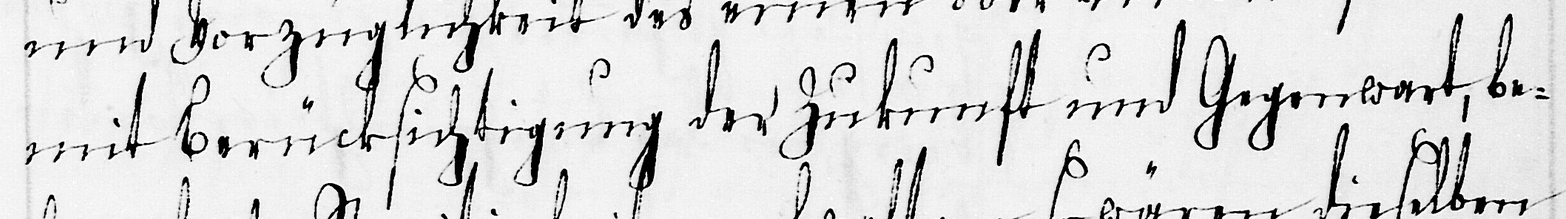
mit Berücksichtigung der Zukunft und Gegenwart, be¬
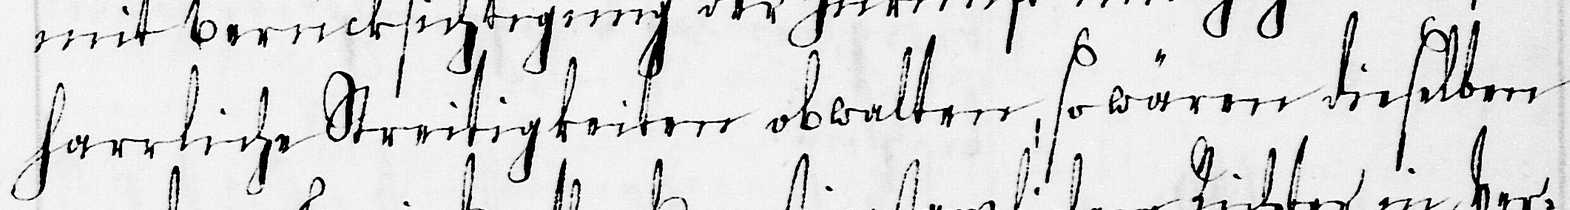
harrliche Streitigkeiten obwalten, so wären dieselben
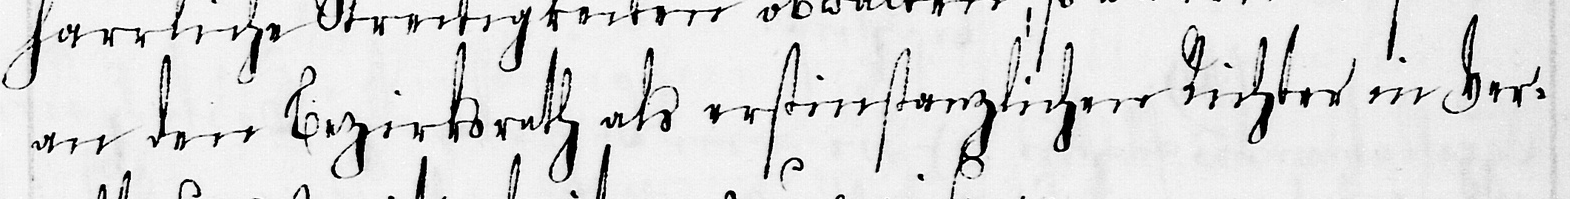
an den Bezirksrath als erstinstanzlichen Richter in Ver¬
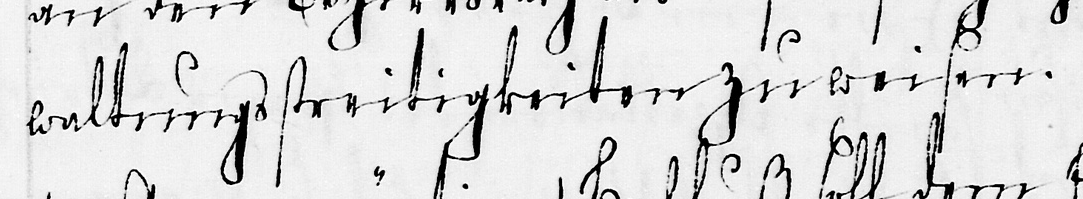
waltungsstreitigkeiten zu weisen.
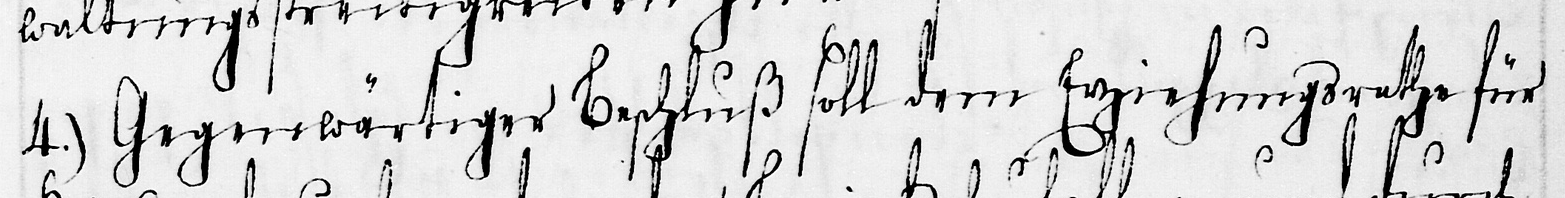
4.) Gegenwärtiger Beschluß soll dem Erziehungsrathe für
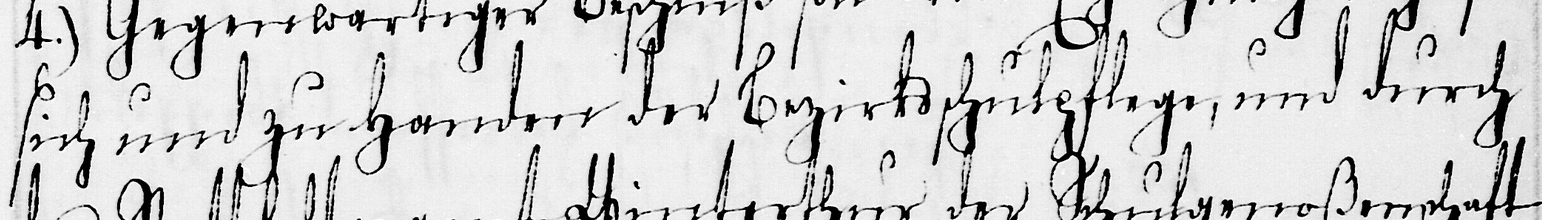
sich und zu Handen der Bezirksschulpflege, und durch
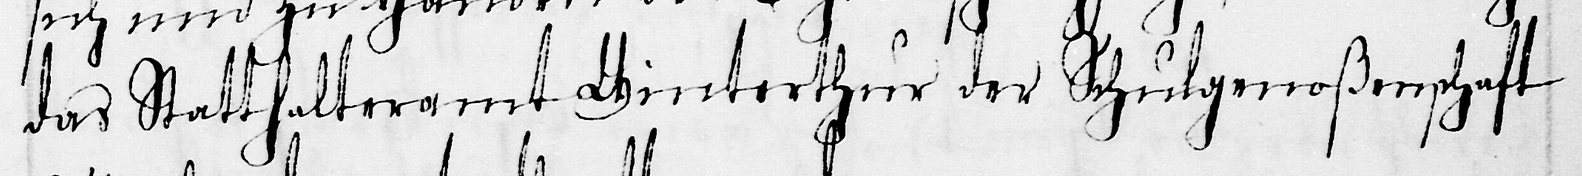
das Statthalteramt Winterthur der Schulgenoßenschaft
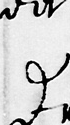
3.)
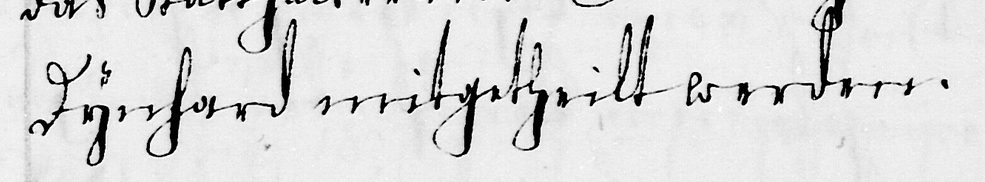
Dynhard mitgetheilt werden.
